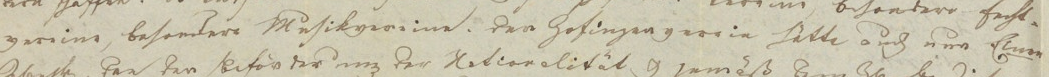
vereine, besondere Musikvereine. Der Zofingerverein hätte auch nur Einen
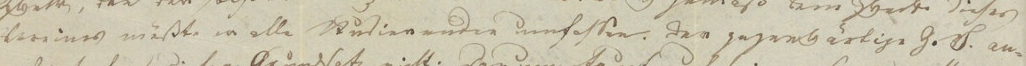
Vereines müßte er alle Studierenden umfassen. Der gegenwärtige Z.V. an-
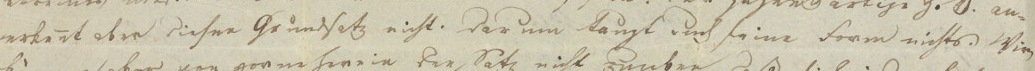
erkennt aber diesen Grundsatz nicht. Darum taugt auch seine Form nichts. Wir
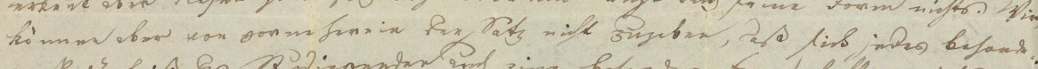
können aber von vorneherein den Satz nicht zugeben, daß sich jedes besonde-
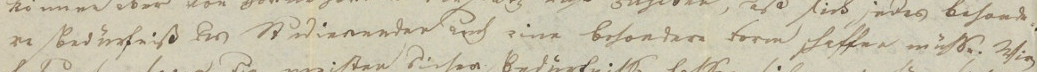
re Bedürfniß des Studierenden auch eine besondere Form schaffen müsse. Wir
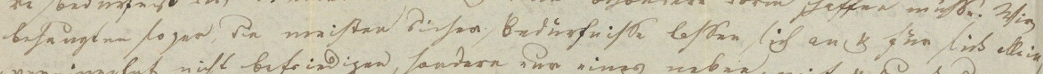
behaupten sogar, die meisten dieser Bedürfnisse lassen sich an & für sich allein,
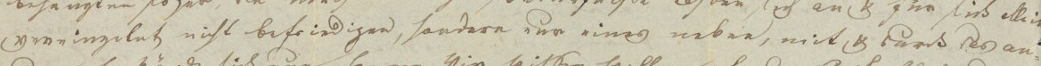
vereinzelet nicht befriedigen, sondern nur eines neben, mit & durch das an-
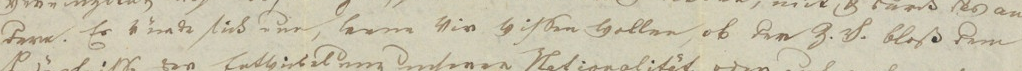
dere. Es würde sich nur, wenn wir wissen wollen, ob der Z.V. bloß dem
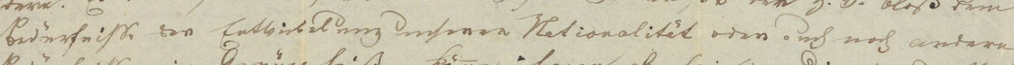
Bedürfnisse der Entwickelung unserer Nationalität oder auch noch andern
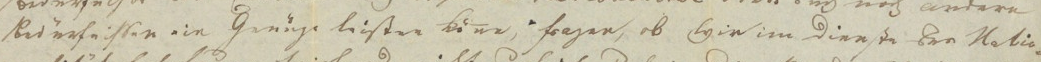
Bedüfnissen ein Genüge leisten könne, fragen, ob wir im Dienste der Natio-
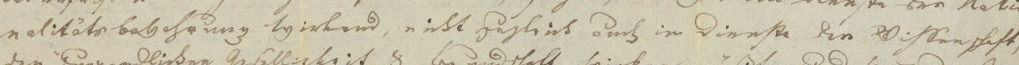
nalitätsbewahrung wirkend, nicht zugleich auch im Dienste der Wissenschaft,
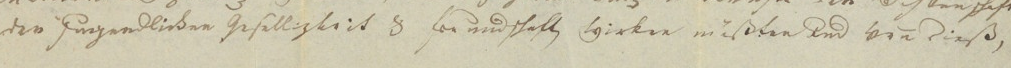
der jugendlichen Geselligkeit & Freundschaft wirken müßten und wenn dieß,
